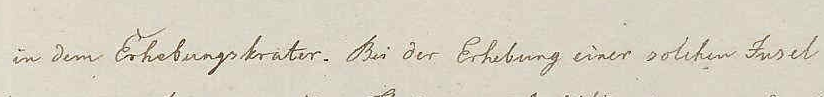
in dem Erhebungskrater. Bei der Erhebung einer solchen Insel
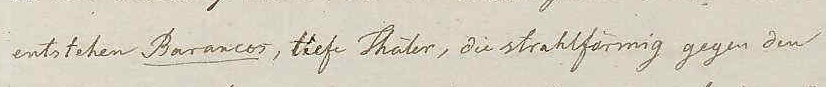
entstehen Barancos, tiefe Thäler, die strahlförmig gegen den
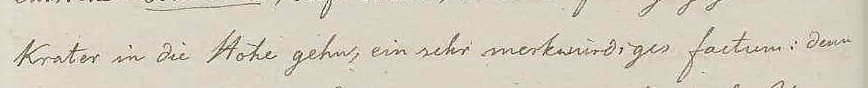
Krater in die Höhe gehn, ein sehr merkwürdiges factum: denn
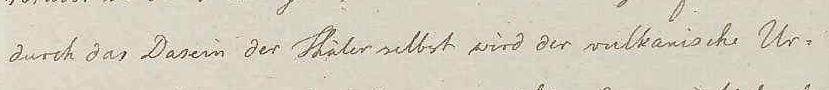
durch das Dasein der Thäler selbst wird der vulkanische Ur-
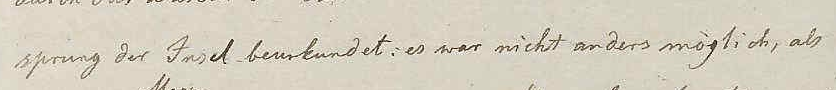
sprung der Insel beurkundet: es war nicht anders möglich, als
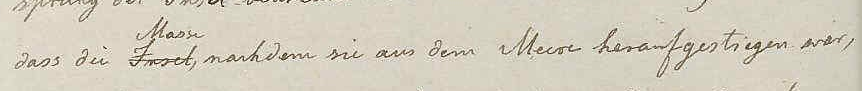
dass die InselMasse, nachdem sie aus dem Meer heraufgestiegen war,
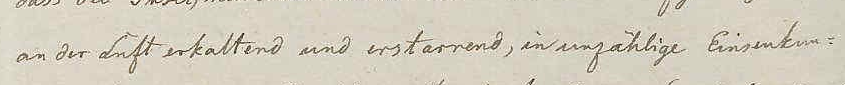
an der Luft erkaltend und erstarrend, in unzählige Einsenkun-
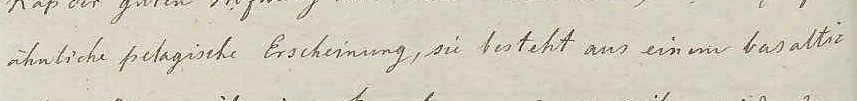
ähnliche pelagische Erscheinung, sie besteht aus einem basalti-
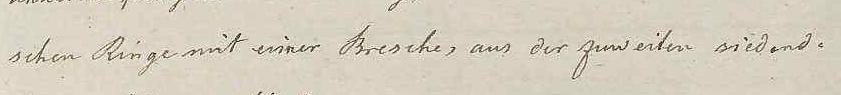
schen Ringe mit einer Bresche, aus der zuweilen siedend-
